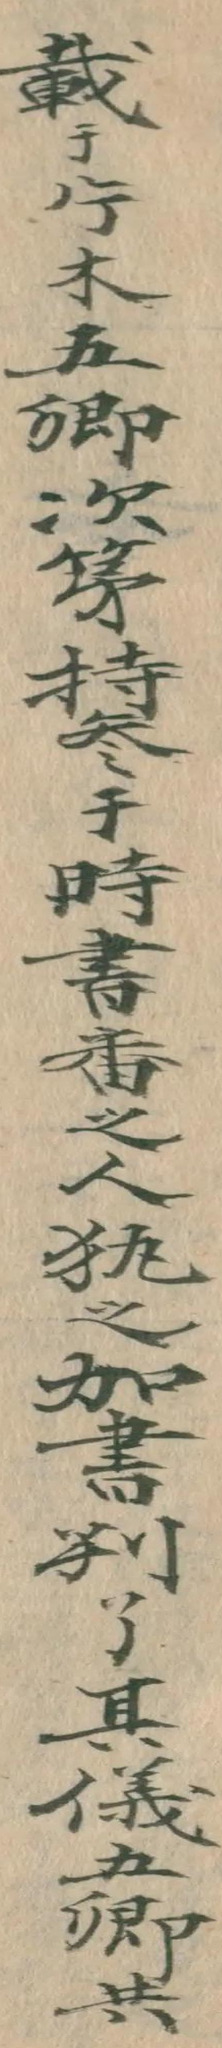載于片木五郷次第持参于時書番之人執之加書判了其儀五郷共
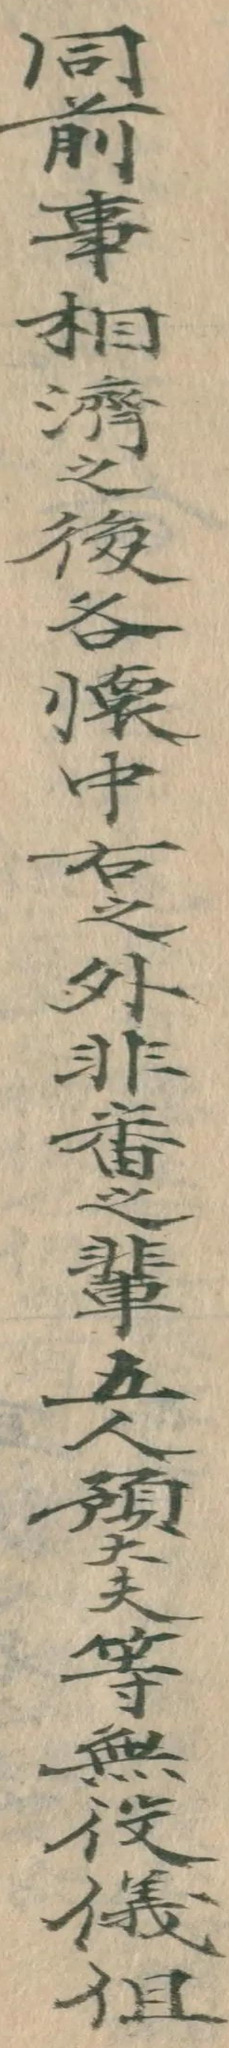同前事相済之後各懐中右之外非番之輩五人預大夫等無役儀但
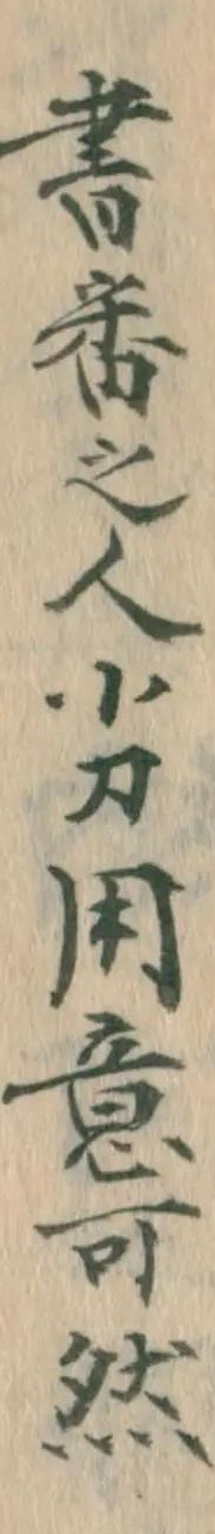書番之人小刀用意可然
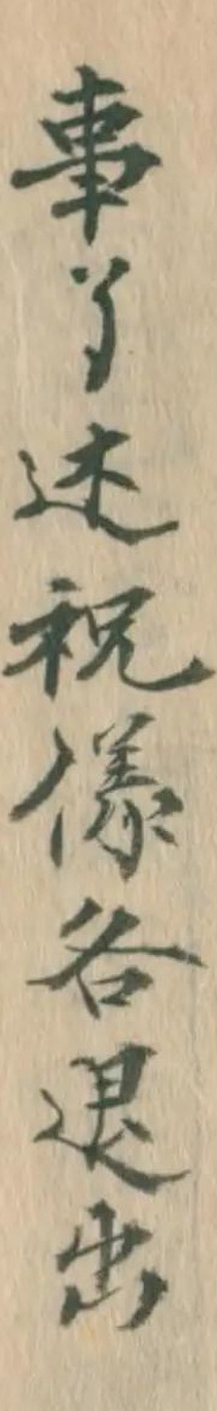事了述祝儀各退出

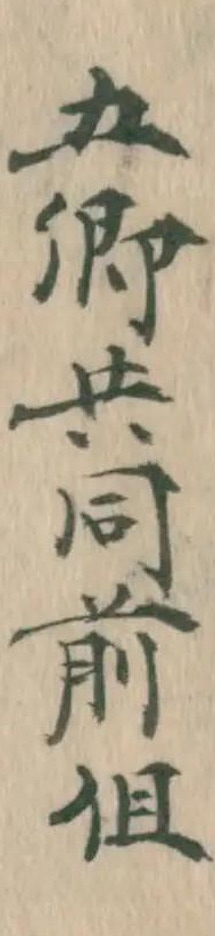五郷共同前但
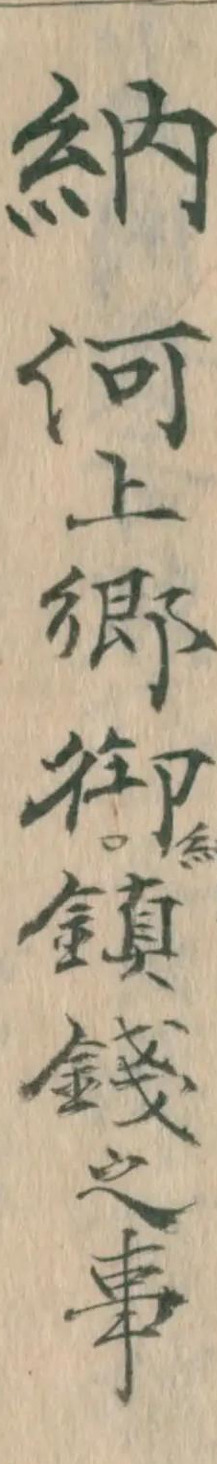納河上郷御◦鎮銭之事
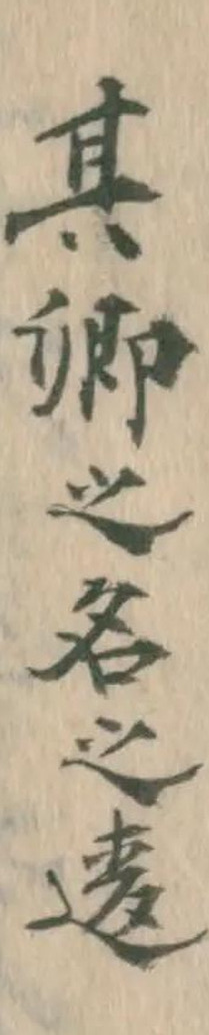其郷之名之違
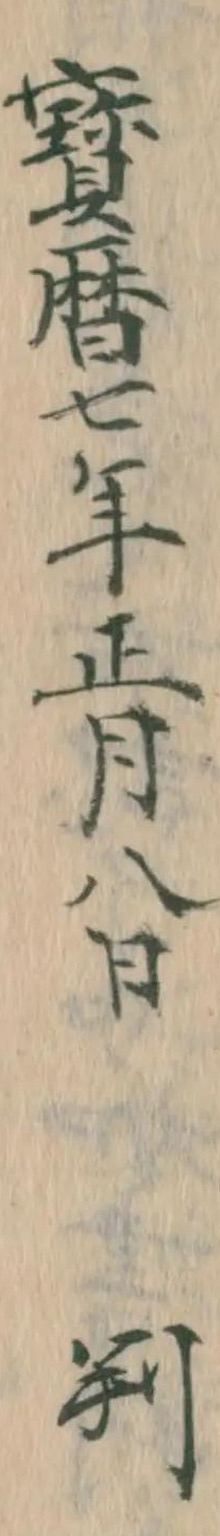宝暦七年正月八日判
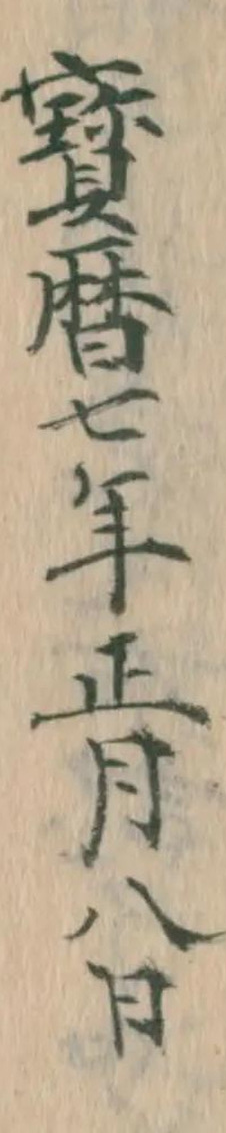宝暦七年正月八日判
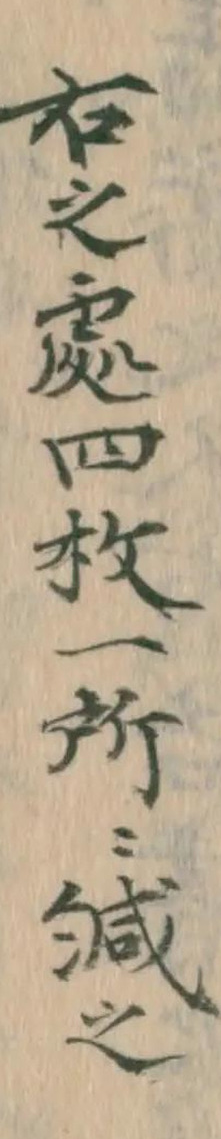右之処四枚一所ニ緘之
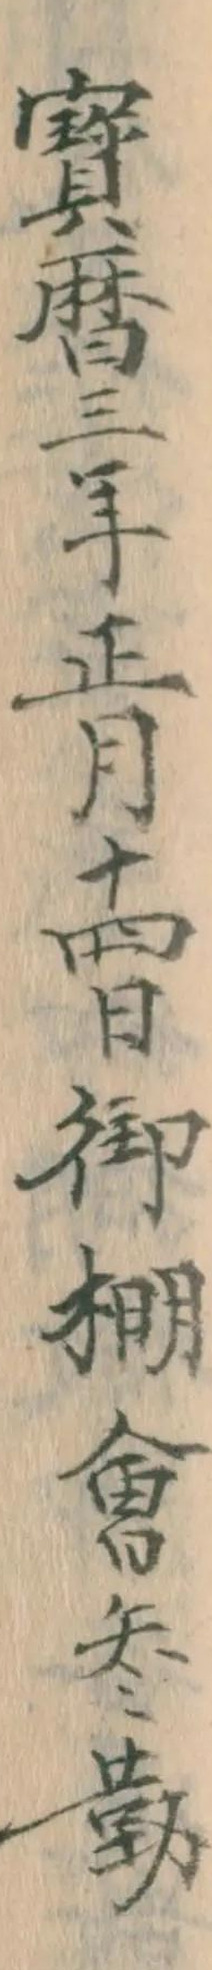宝暦三年正月十四日御棚会参勤

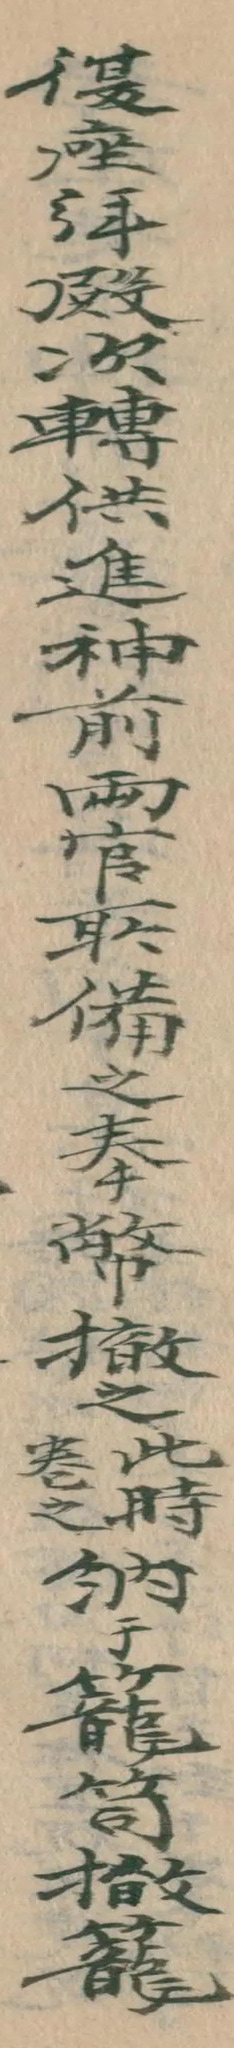復座拝殿次転供進神前両官取備之奉幣撤之此時巻之納于籠笥撤籠
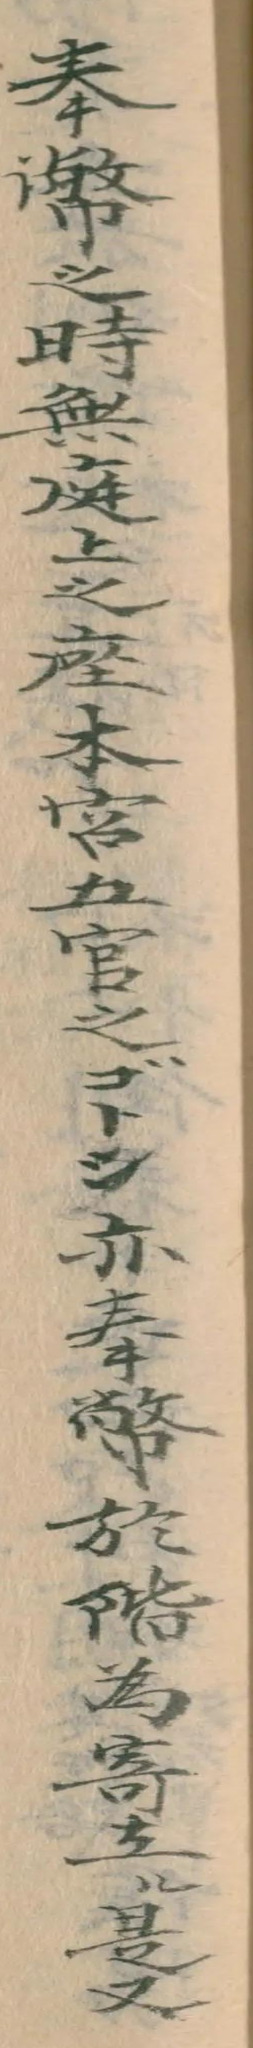奉幣之時無庭上之座本宮五官之ゴトシ亦奉幣於階為寄立ル是又
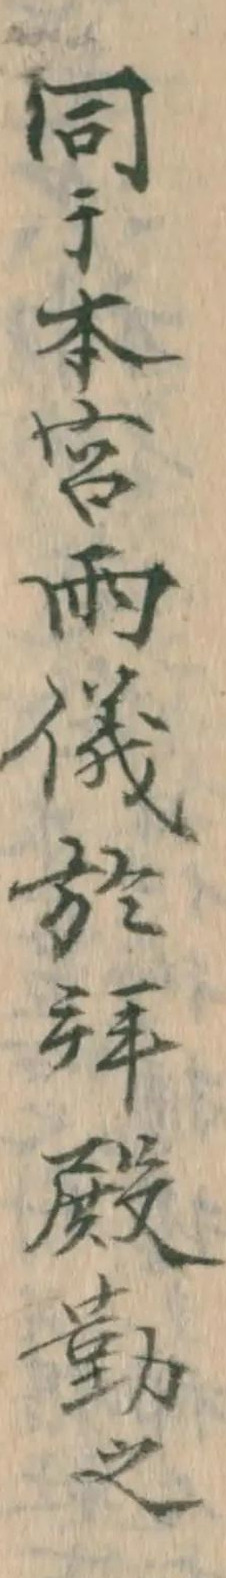同于本宮雨儀於拝殿勤之
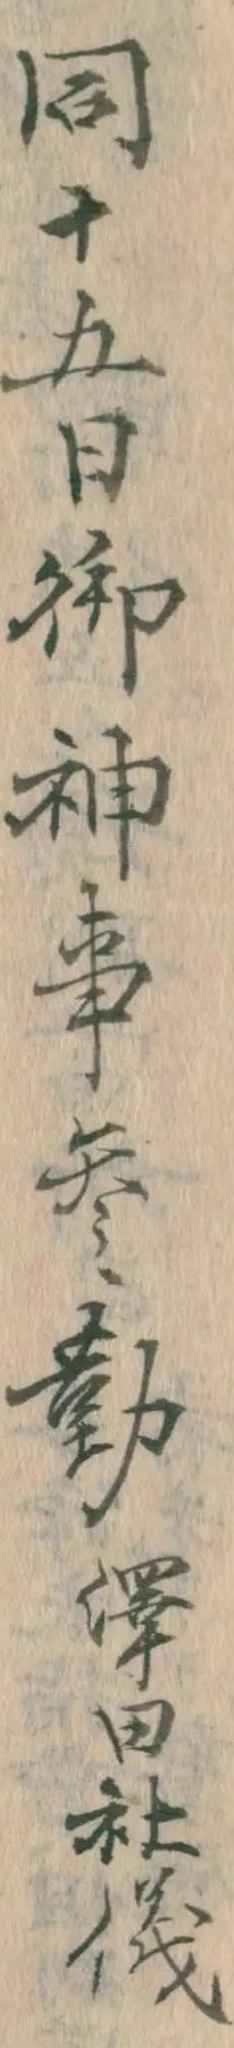同十五日御神事参勤沢田社儀
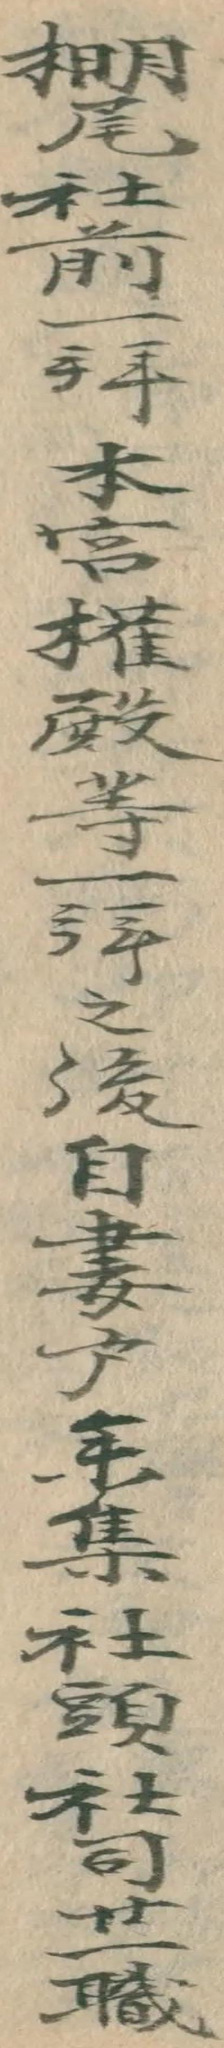棚尾社前一拝本宮權殿等一拝之後自妻戸参集社頭社司廿一職
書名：賀茂社記録. 第9冊
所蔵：国立国会図書館 National Diet Library, JAPAN
